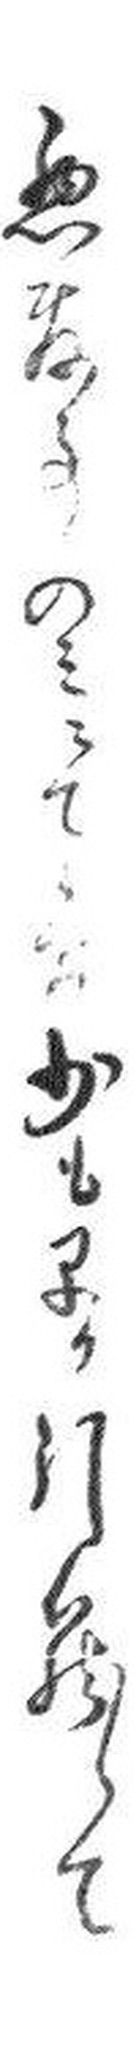悪敷事のミニて候間少も早ク引籠候て
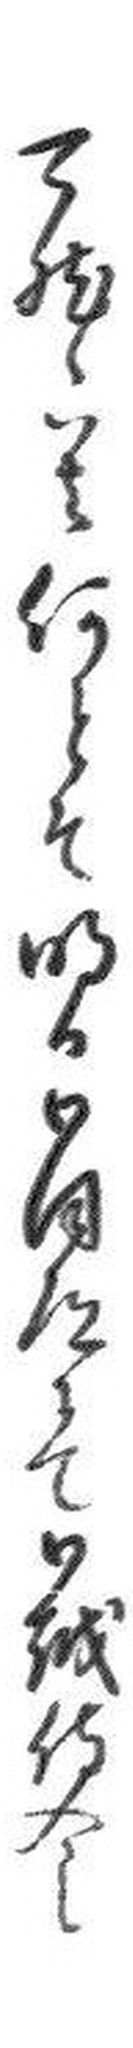可然候ハ者何とそ明日御同道にて御越待入申候
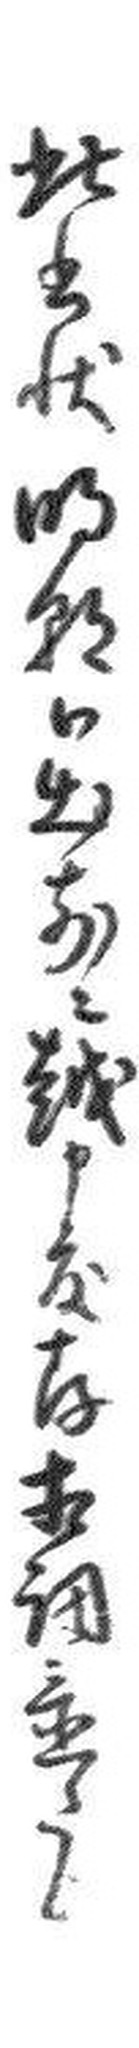此書状明朝御出前ニ越申度存相調置候以上
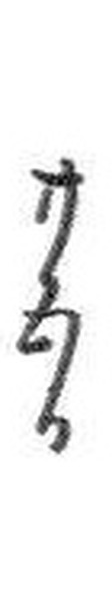廿五日
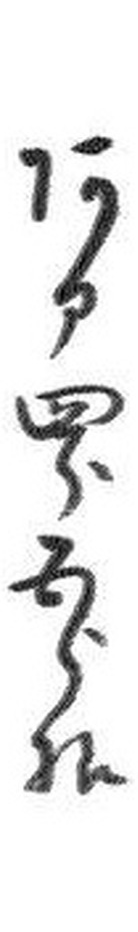阿部四郎五郎様
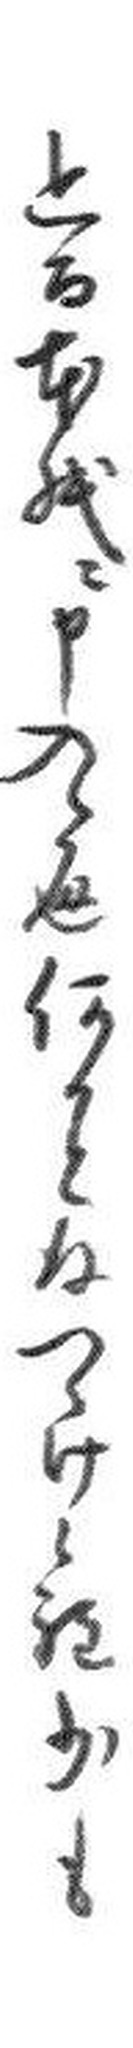追而本紙ニ申入候通何かと存つゝけ候程少も
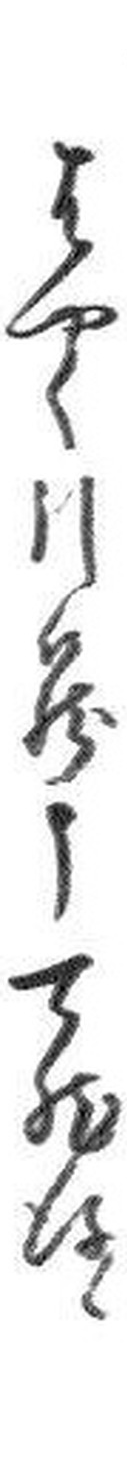はやく引籠申可然存候
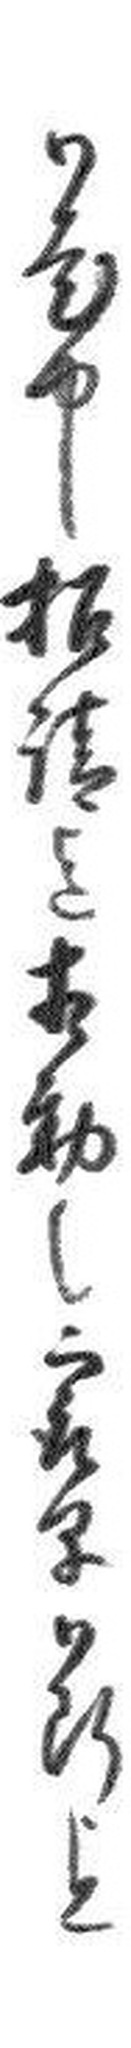御老中招請迄相勤申候最早同御申上
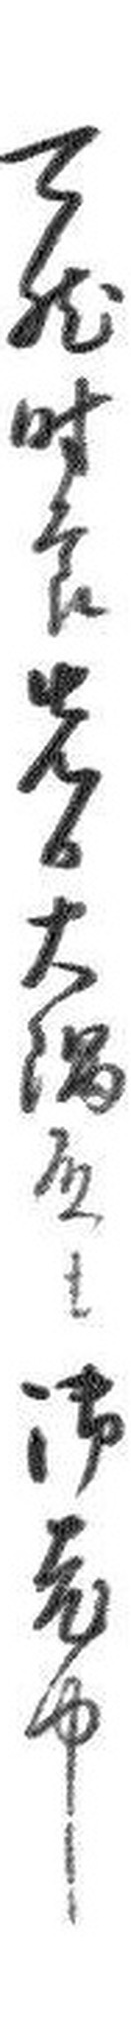可然時節先日大隅殿も御老中

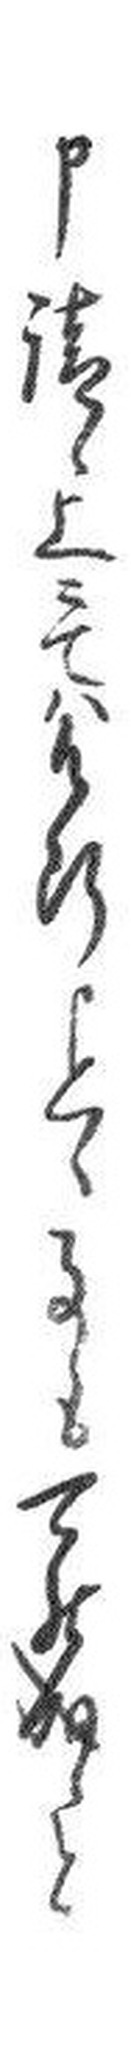申請候上ニてハ御断申上候事も可罷成候と
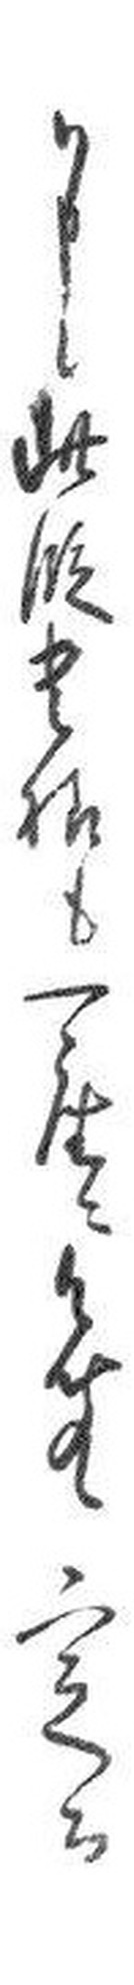御申候此段貴様も一座ニ御聞候定而
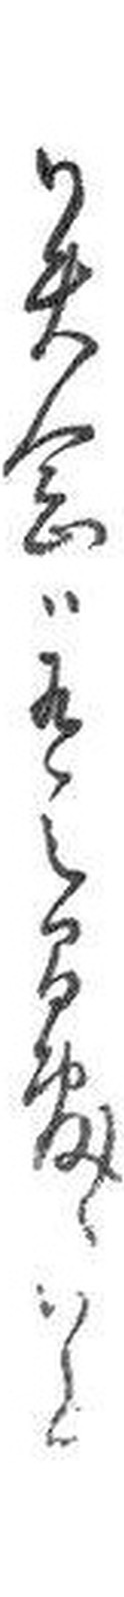御失念ハ有之間敷候以上
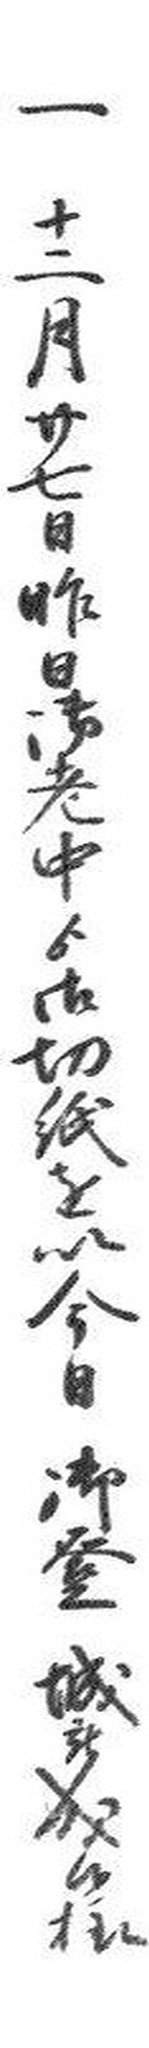一十二月廿七日昨日御老中ゟ御切紙を以今日御登城被成候様
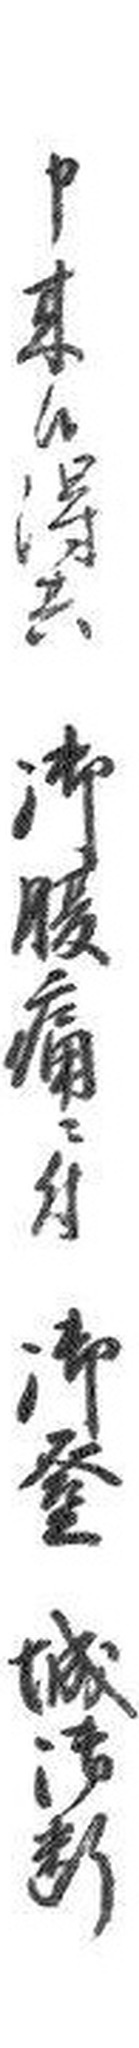申来候得共御腹痛ニ付御登城御断
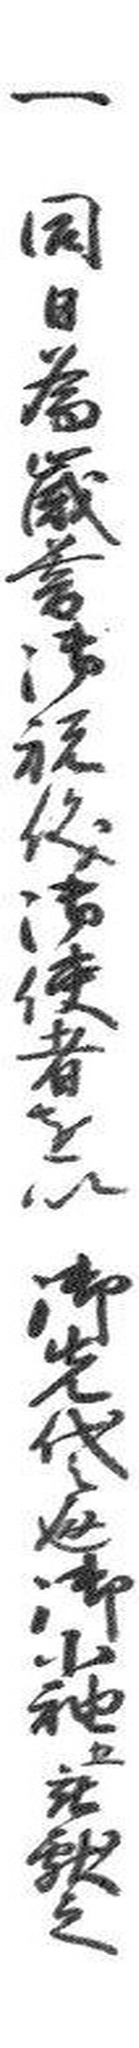一同日為歳暮御祝儀御使者を以御先代之通御小袖五被献之
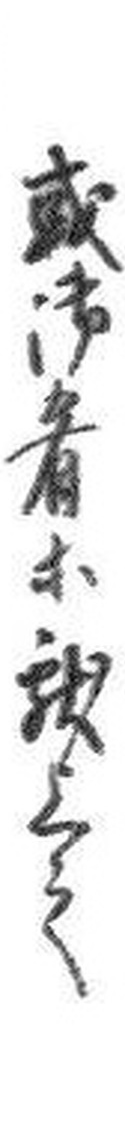或御肴等献上之
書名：家譜 十一 昌親公 従延宝二年到延宝四年八月
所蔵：福井県文書館 Fukui Prefectural Archives
